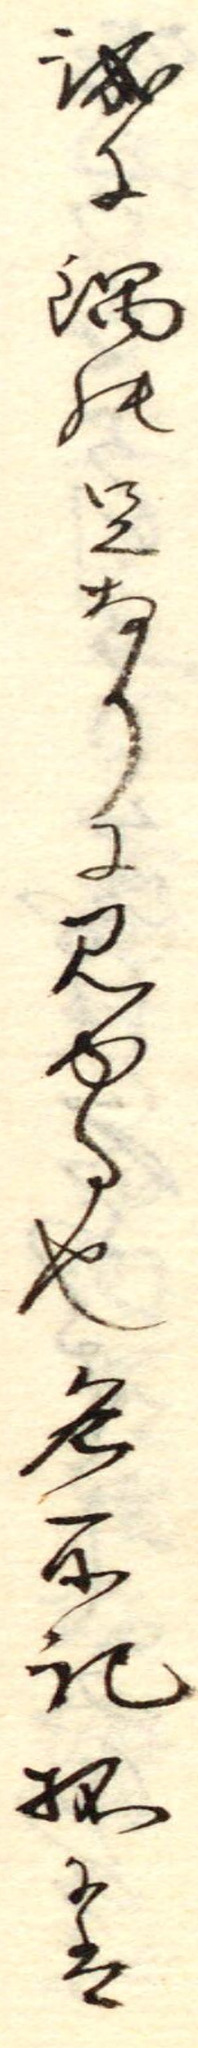誠に鍋の足なりに見ゆる也名所記抔には
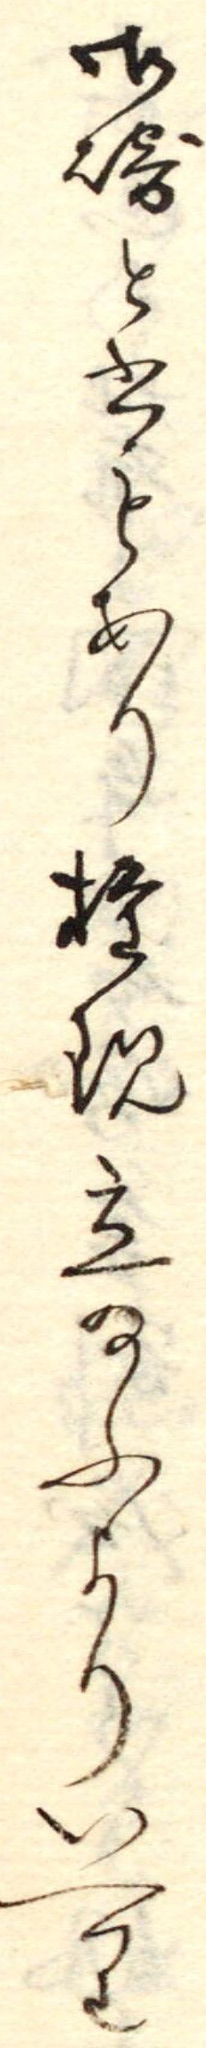御崎と書もあり権現立給ふによりいへり
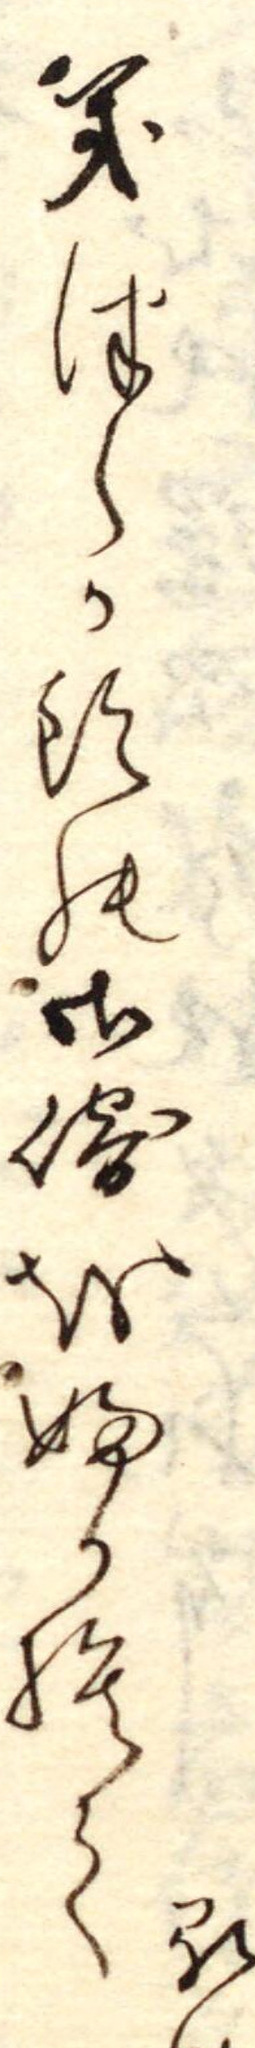幾つしか鈴の御崎をふり捨て
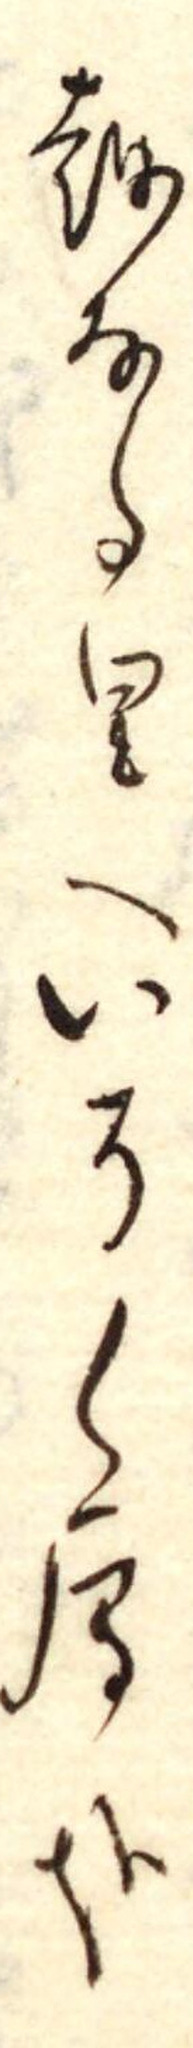越なる里へいそく鳫哉
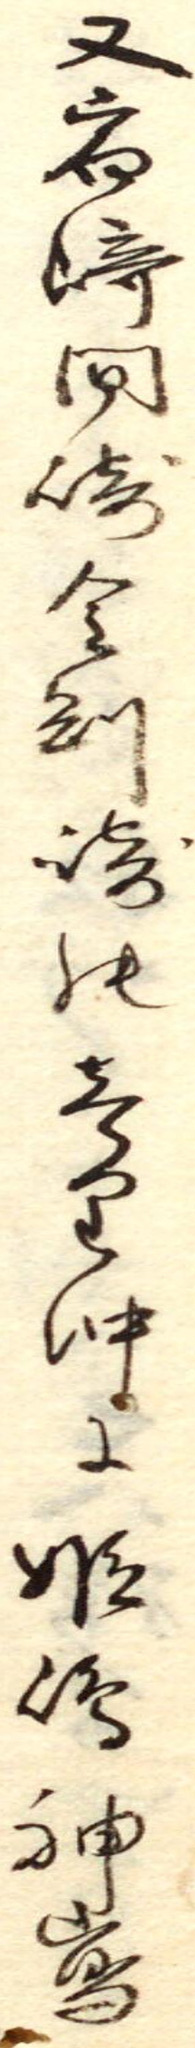又宿崎問崎金剛崎の壱里沖に姫嶋神嶌
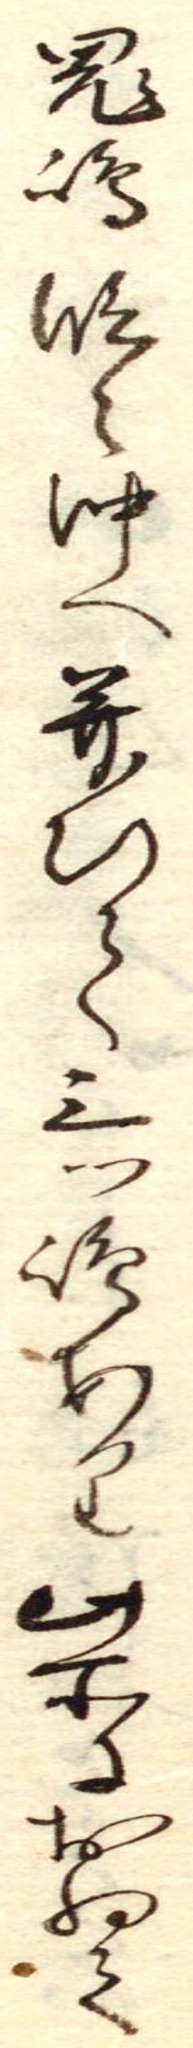鬼嶋段々沖へ并ひて三ッ嶋あり此所におゐて
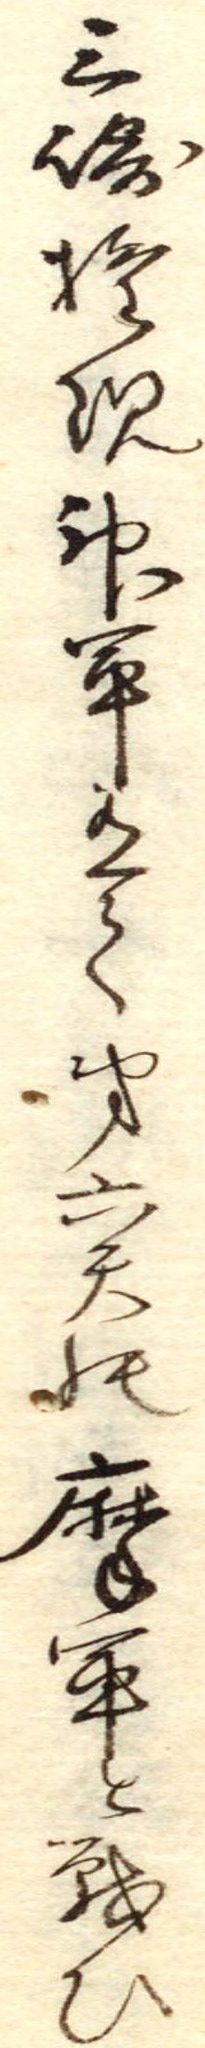三嶋権現神軍有て第六天の摩軍と戦ひ
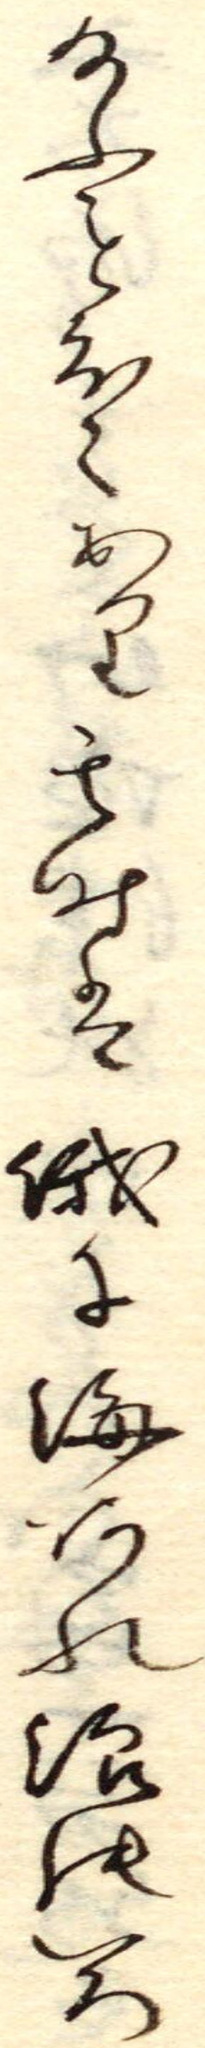給ふこと度々あり其時は俄に海あれ浪のいろ
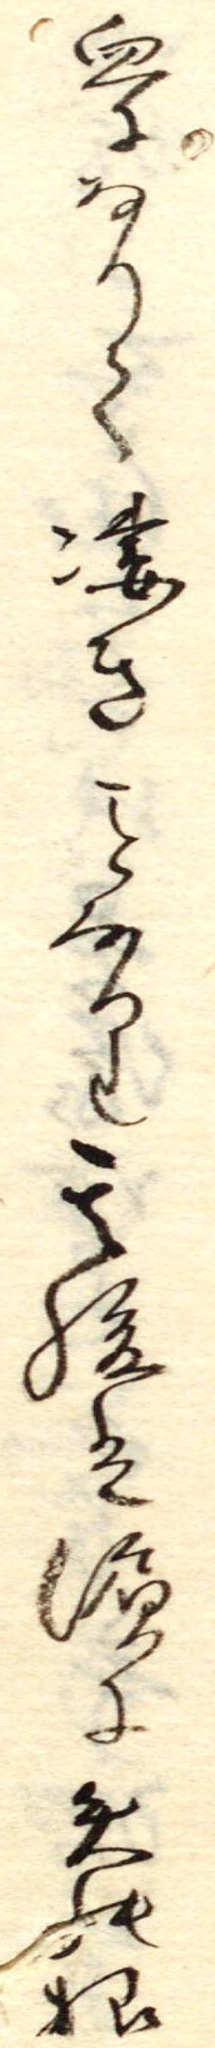血になりて凄きことなり其後は浜に矢の様
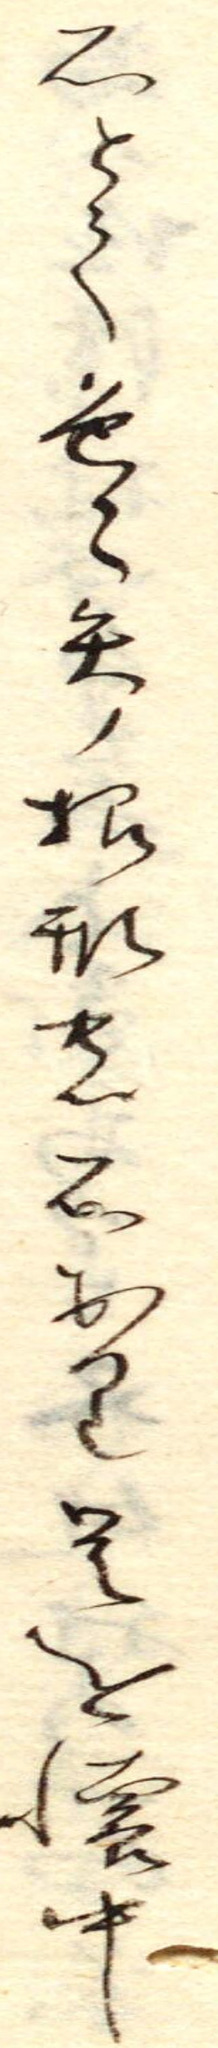石とて色々矢ノ様形の石あり是を懐中
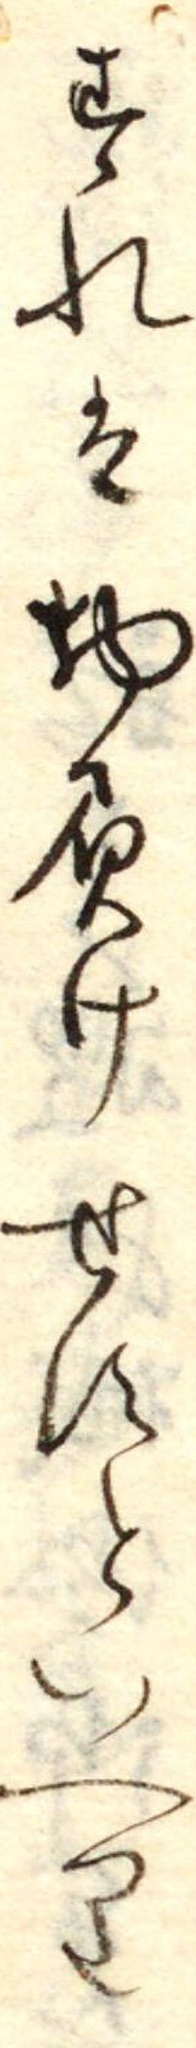すれは物負けせすといへり
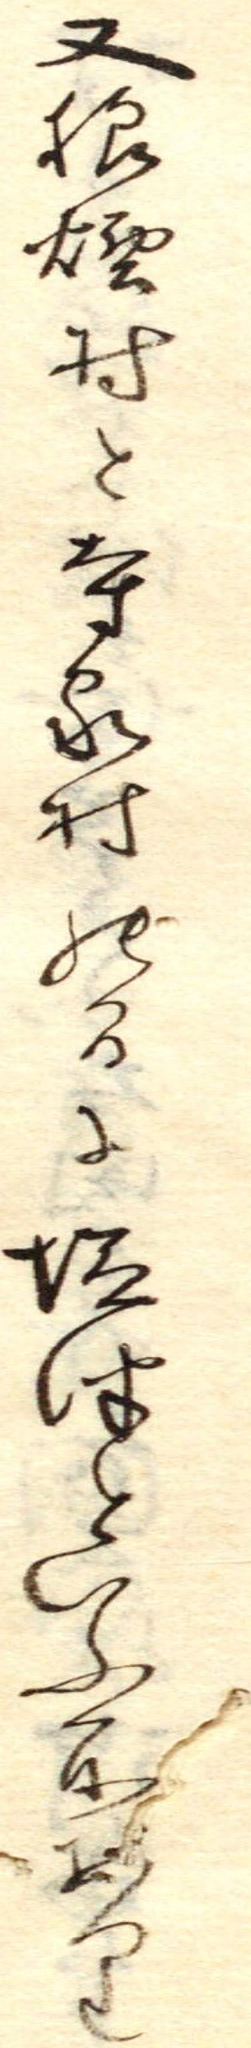又狼煙村と寺家村の間に塩津といふ所あり
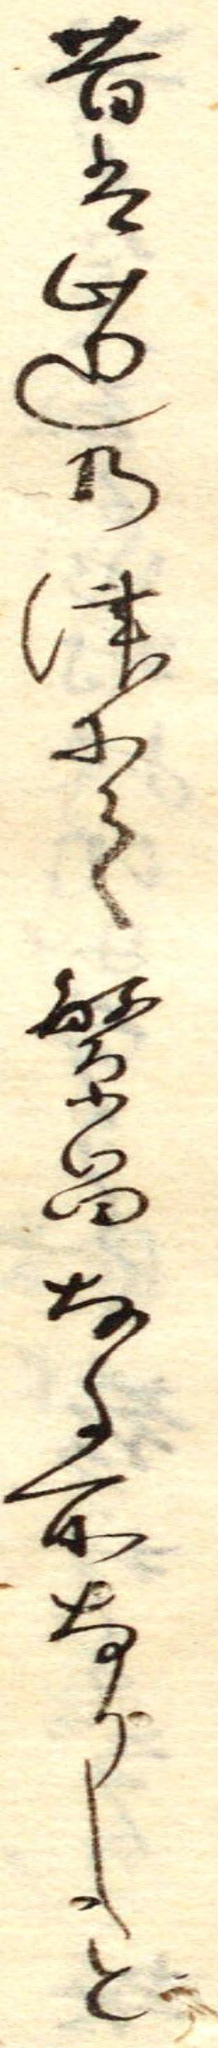昔は此辺の津にて繁昌なる所なりしと

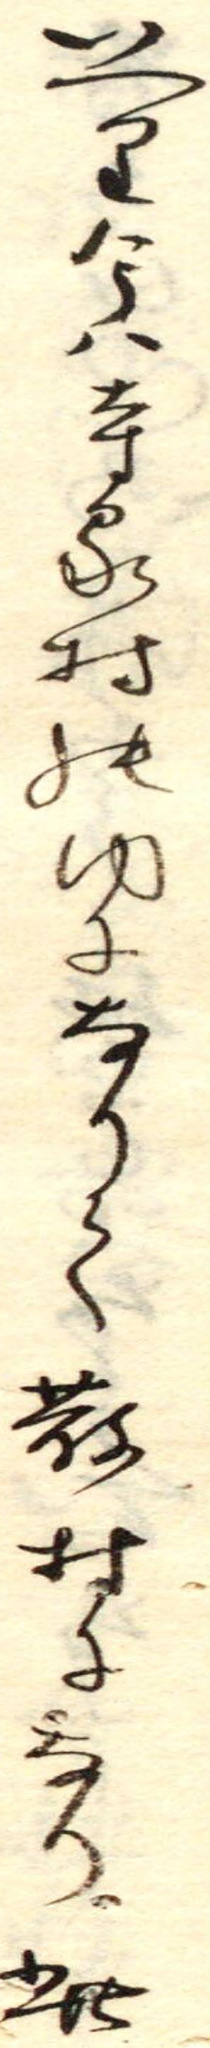いへり今は寺家村の内になりて散村になり此
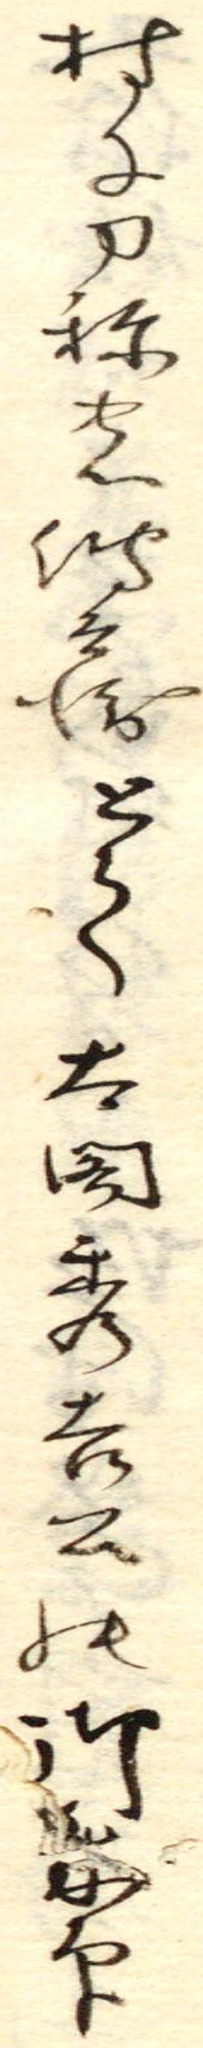村に刀祢の伝兵衛とて太閤秀吉公の御朱印
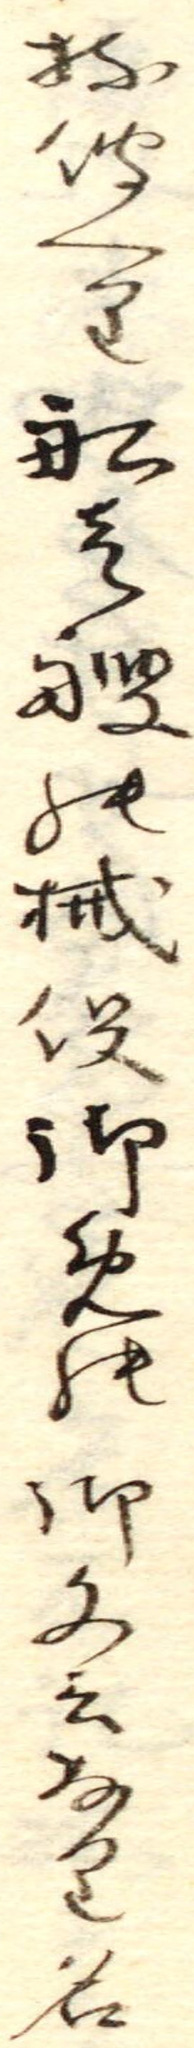抔伝へり船壱艘の械役御免の御文言なり名
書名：能登名跡誌
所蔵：Ishikawa Prefectural Library
